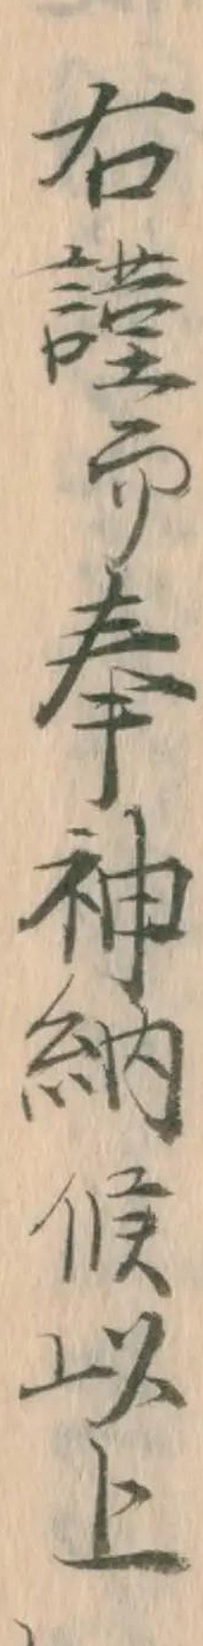右謹而奉神納候以上
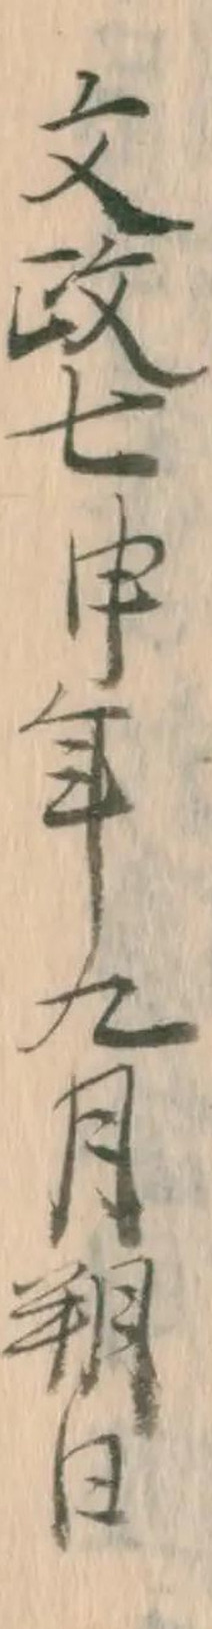文政七申年九月朔日
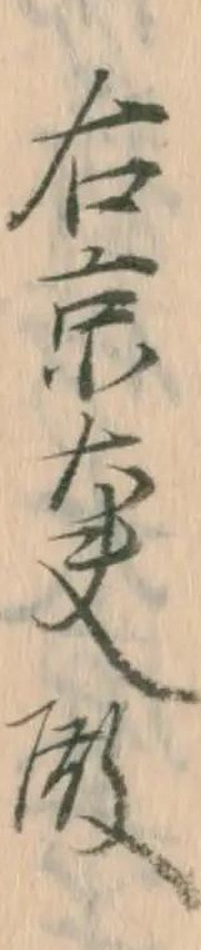右京大夫殿
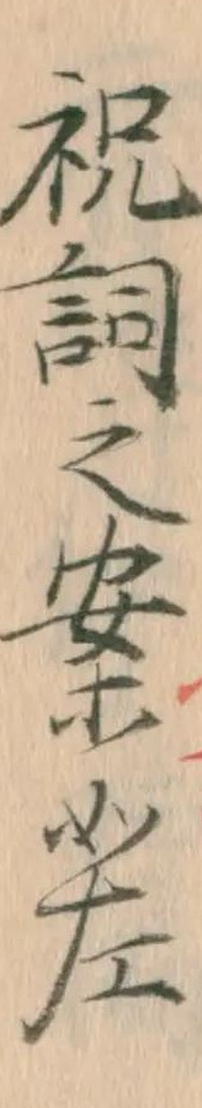祝詞之案如左
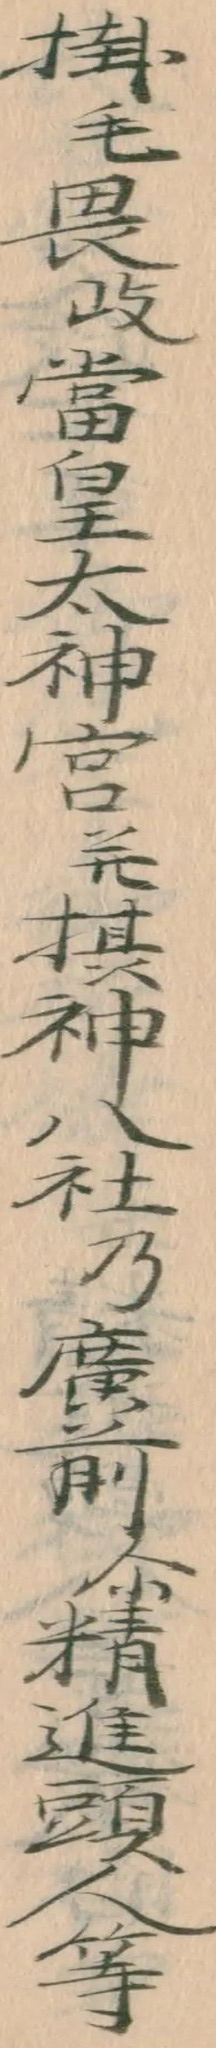掛毛畏岐當皇太神宮并摂神八社乃廣前尒精進頭人等
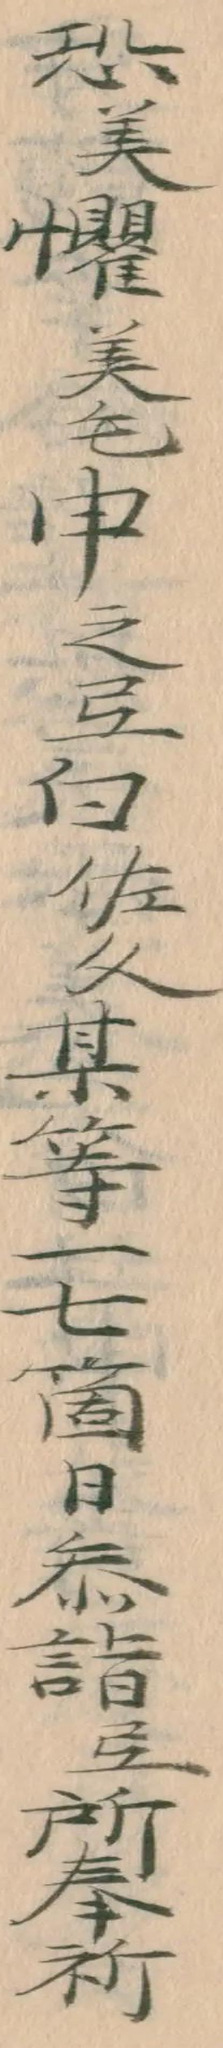恐美懼美毛申之弖白佐久某等一七箇日参詣弖所奉祈
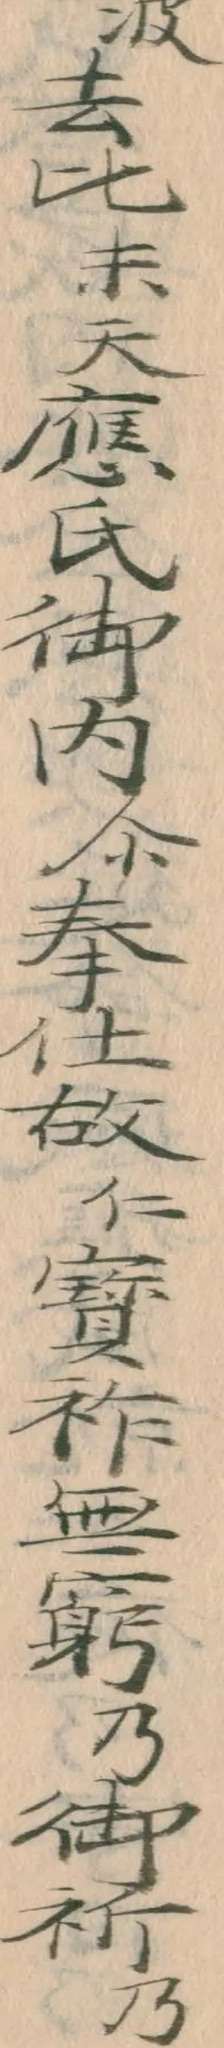波去比末天應氏御内尒奉仕故仁寶祚無窮乃御祈乃
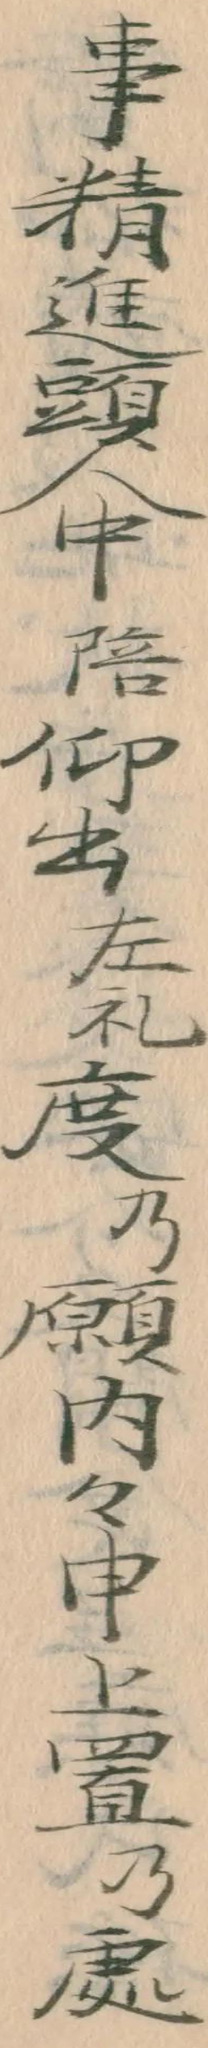事精進頭人中陪仰出左礼度乃願内々申上置乃處
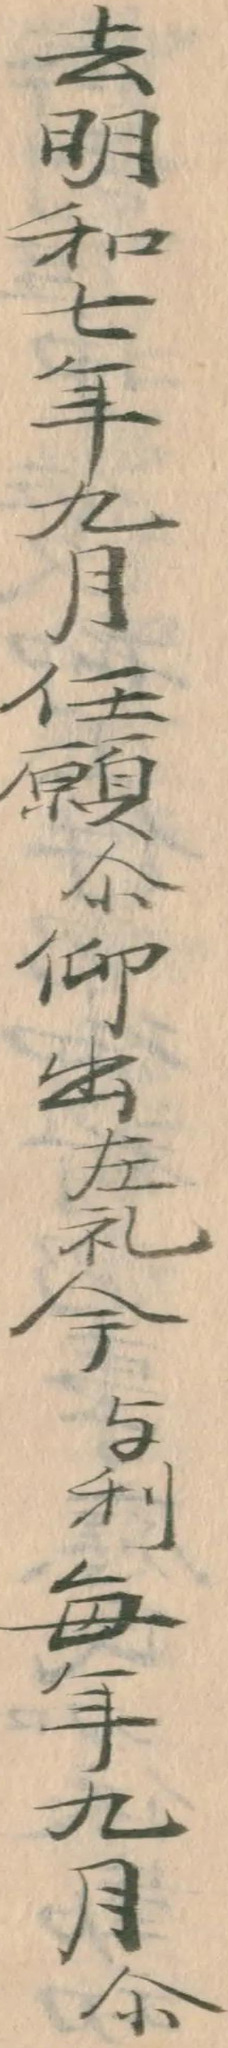去明和七年九月任願尒仰出左礼今与利毎年九月尒
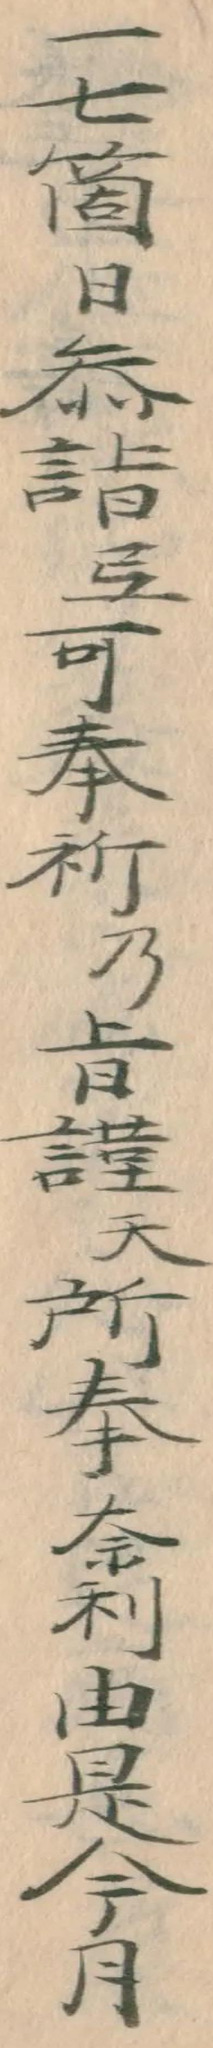一七箇日参詣弖可奉祈乃旨謹天所奉奈利由是今月
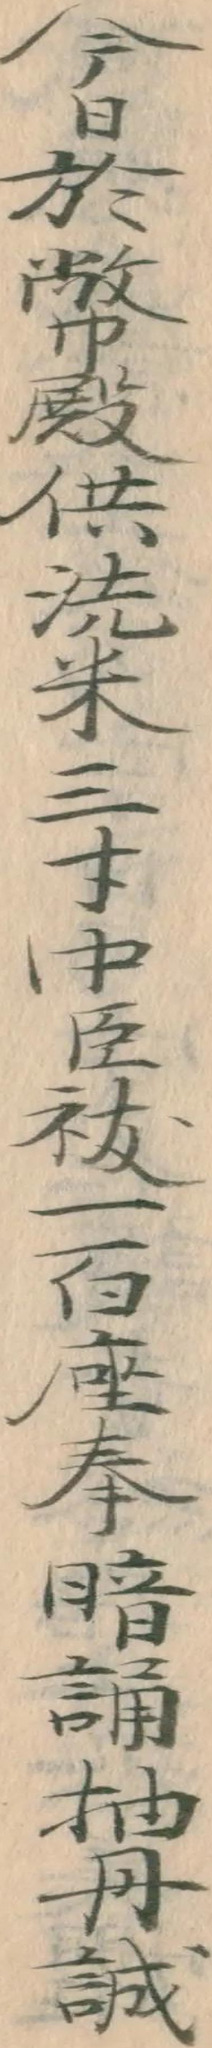今日於幣殿供洗米三寸中臣祓一百座奉暗誦抽丹誠
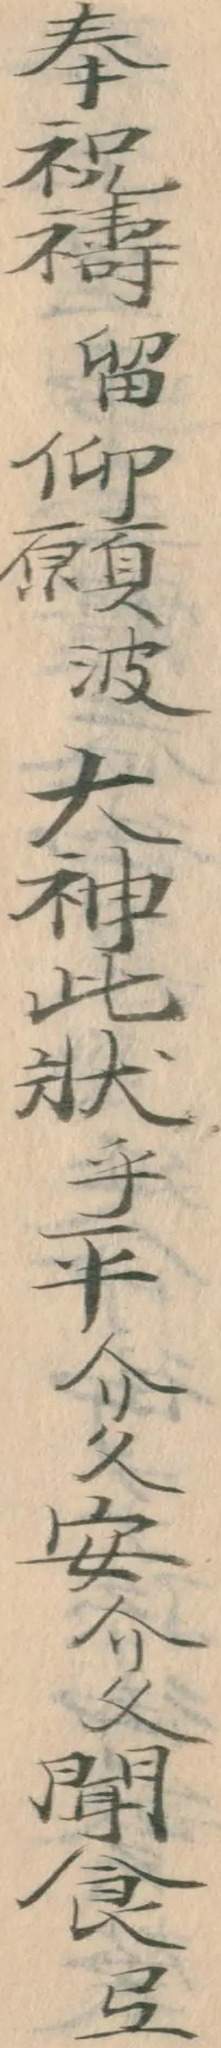奉祝祷留仰願波大神此状乎平介久安介殿聞食弖
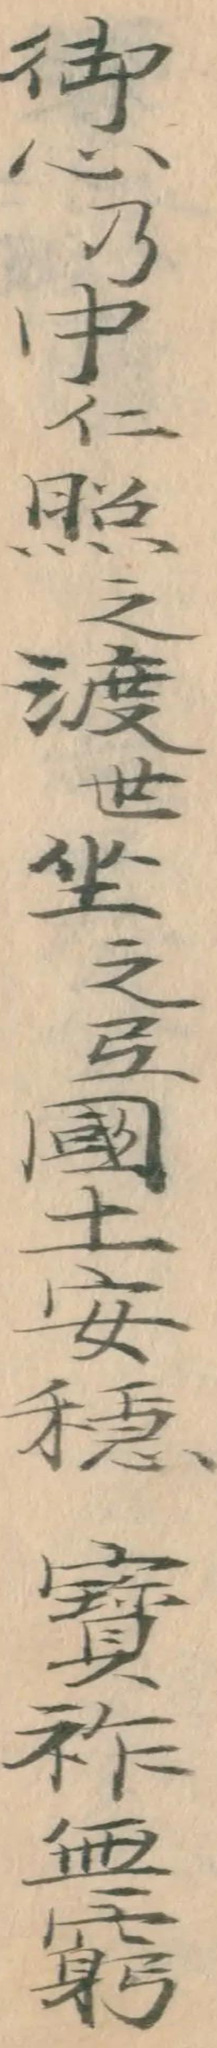御心乃中仁照之渡世坐之弖國土安穏寶祚無窮

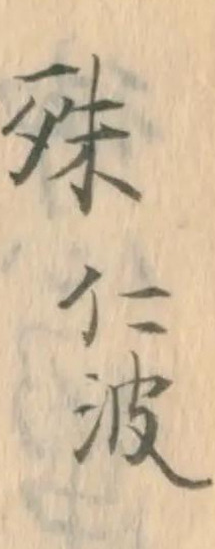殊仁波
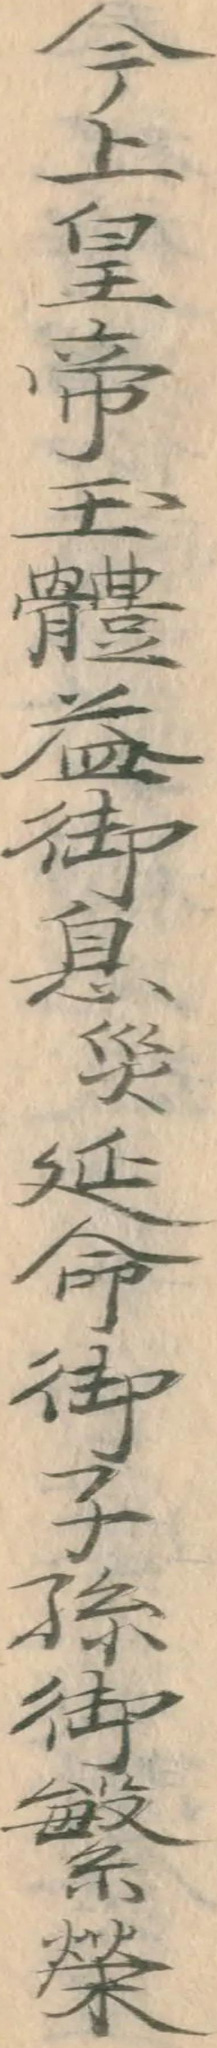今上皇帝玉體益御息災延命御子孫御繁榮
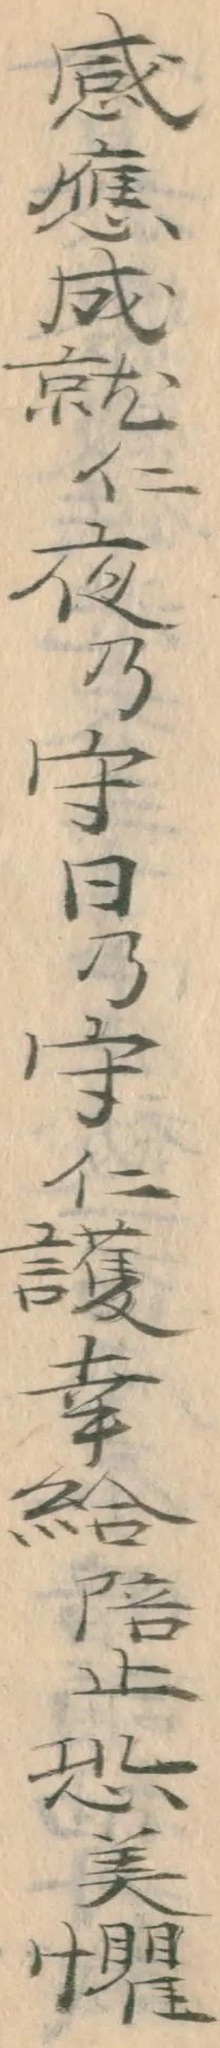感應成就仁夜乃守日乃守仁護幸給陪止恐美懼
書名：賀茂社記録. 第74冊
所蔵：国立国会図書館 National Diet Library, JAPAN
